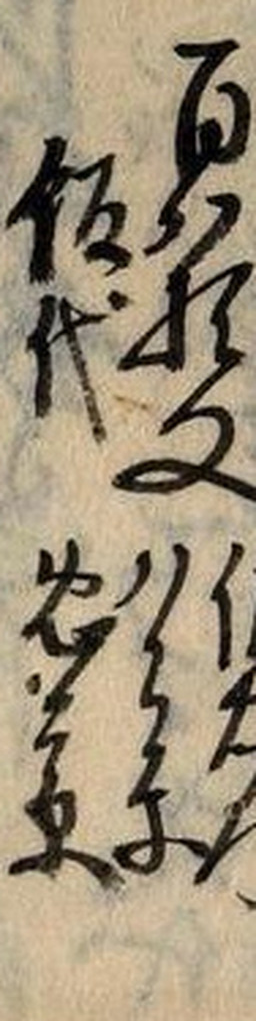飯代八兵衛
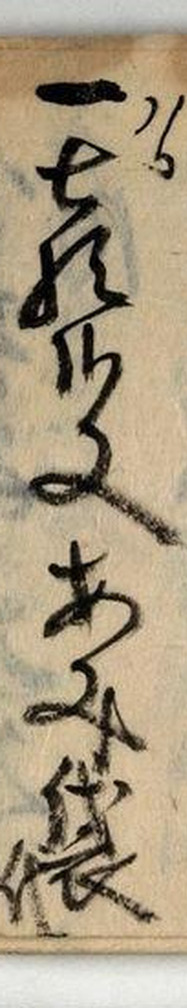一七拾弐文あみ袋代
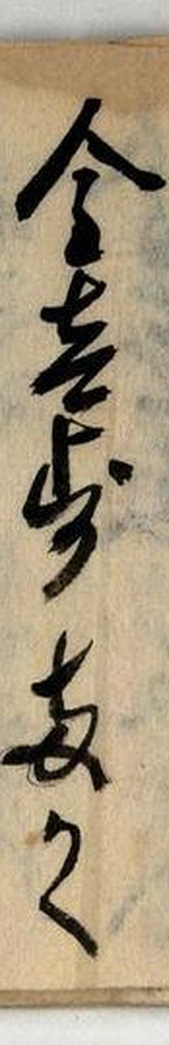金壱歩両かへ
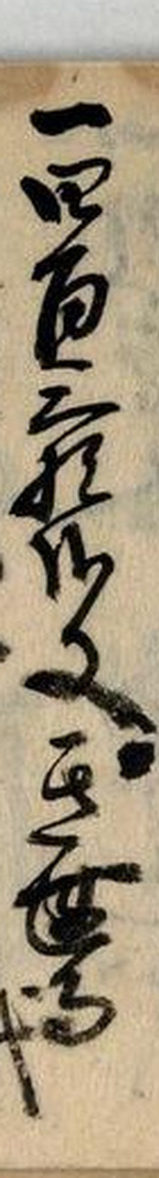一四百三拾弐文きせる代
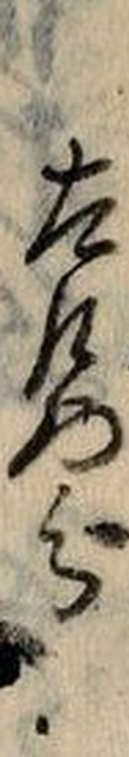太左衛門分
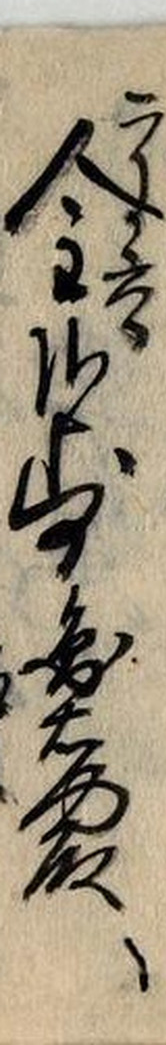金弐歩円右衛門殿渡ス
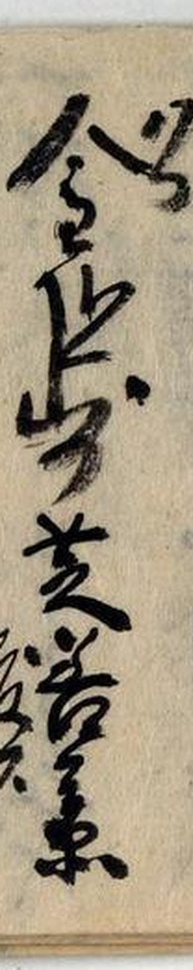金弐歩芝善兵衛渡ス
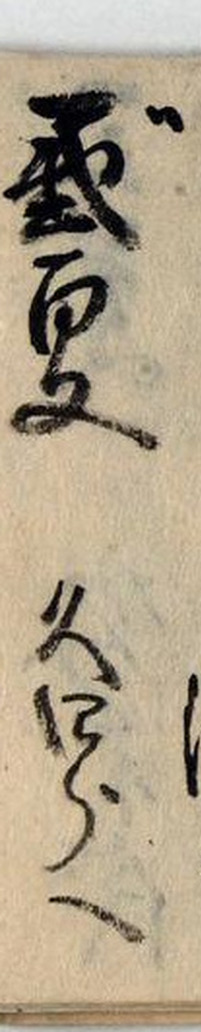一弐百文久四郎ヘ

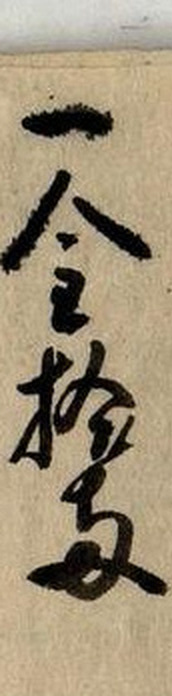一金拾両
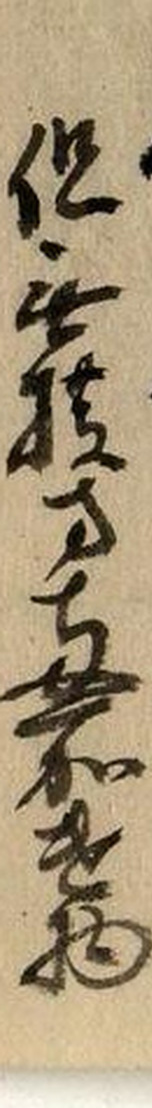但無據方両所遣物
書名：道中小遣留帳（旅）
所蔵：福井県文書館 Fukui Prefectural Archives
